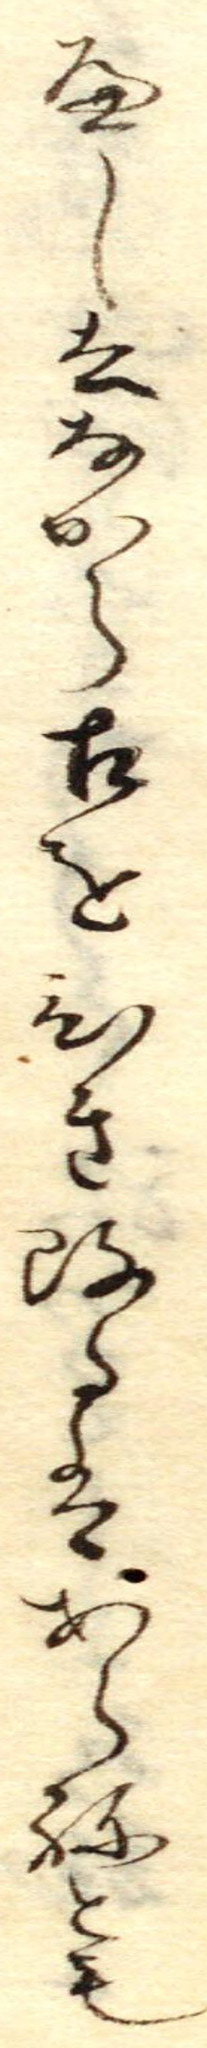へし去なから古をひき改るはあらねとも
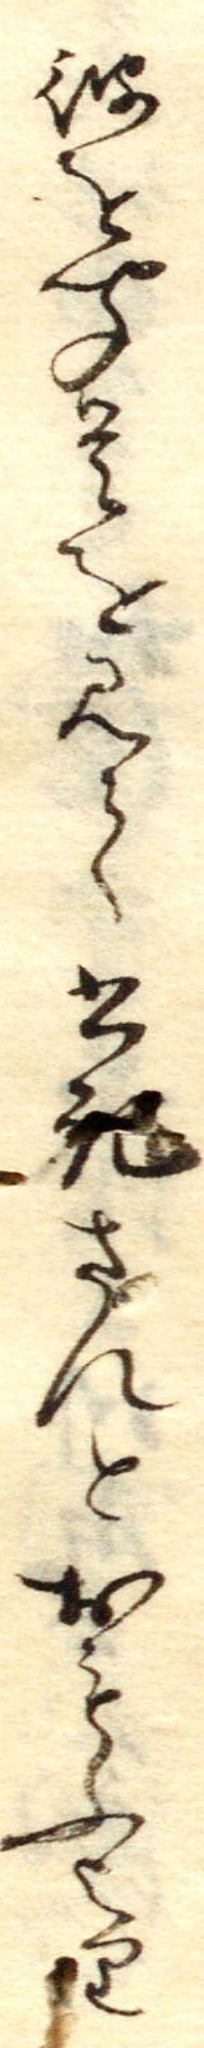彼を聞是を見て書記さんとおもふより
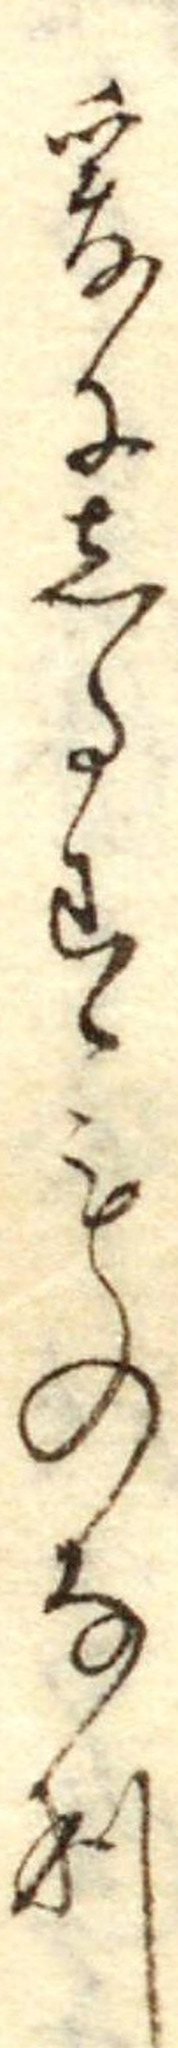爰にしるすものなり

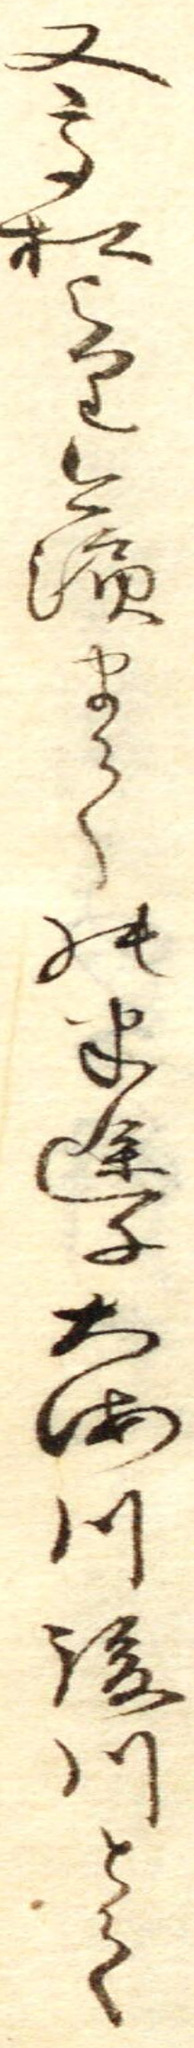又高松より今濱まての半途に大海川後川とて
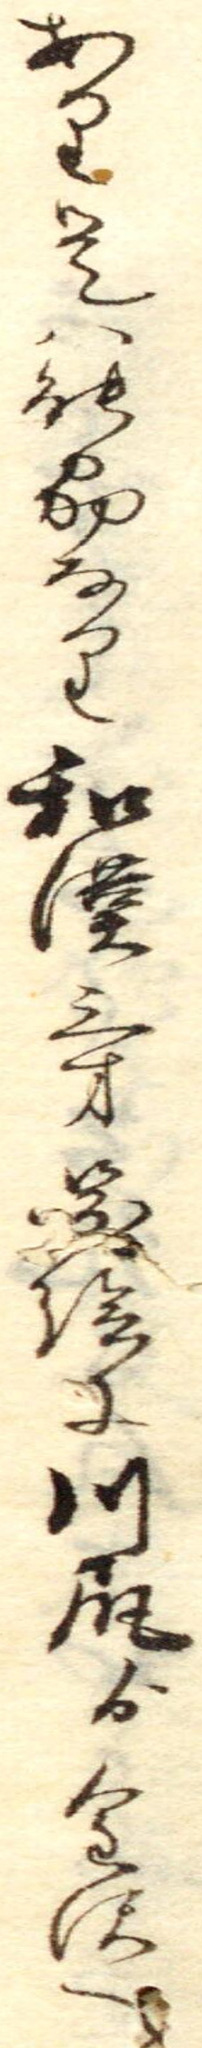あり是は能州なり和漢三才図絵に河尻ゟ金沢へ
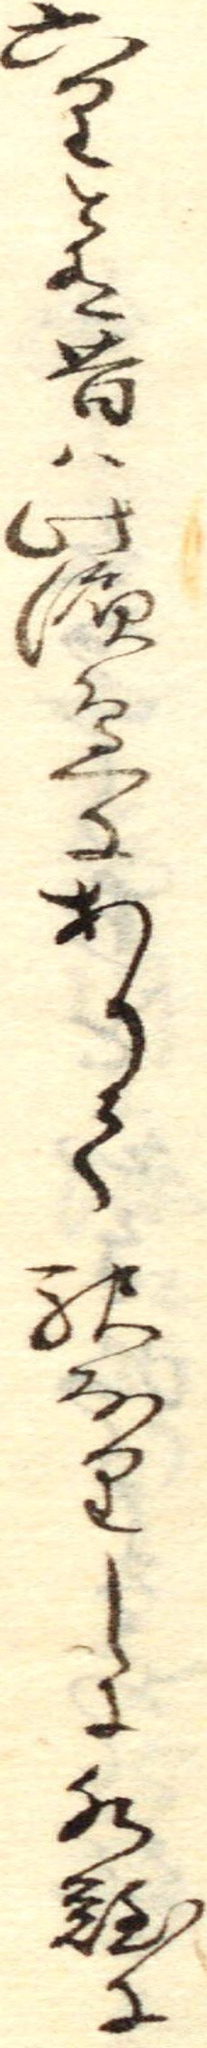六里と有昔は此浜辺にありて駅なりしに水難に
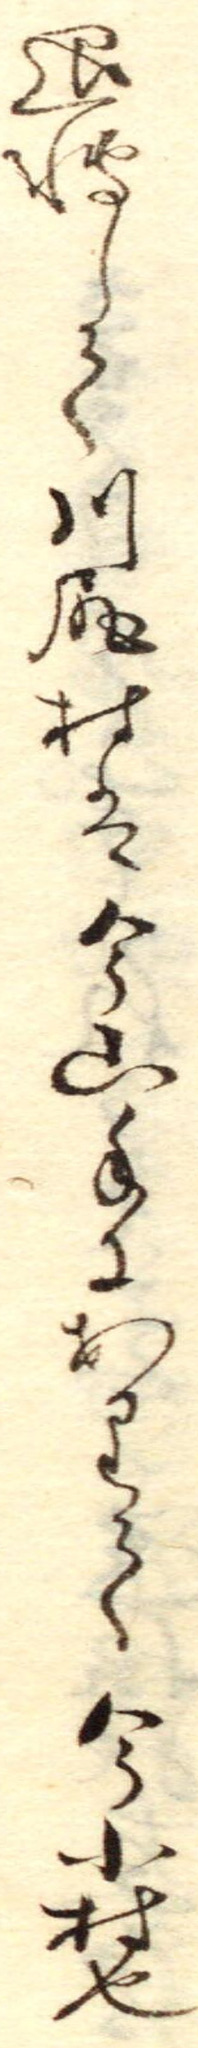退転して河尻村は今山手にありて今小村也
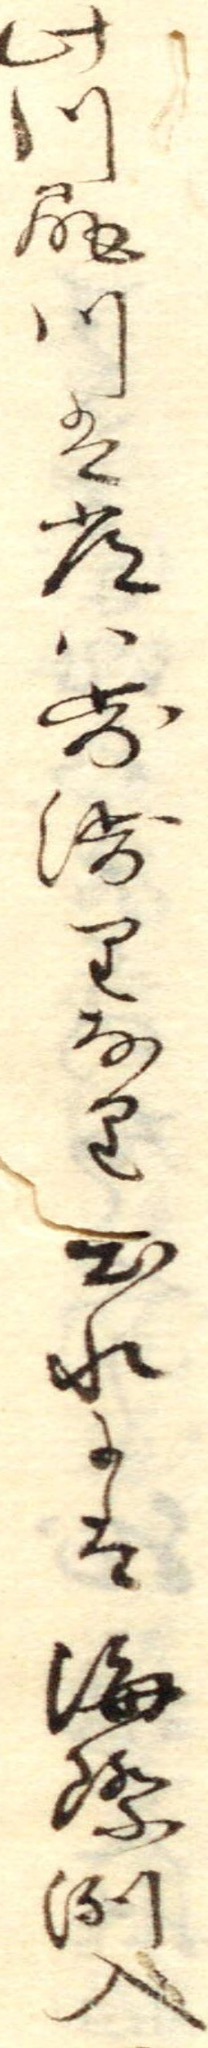此川尻川は常は歩渉りなり出水には海際入
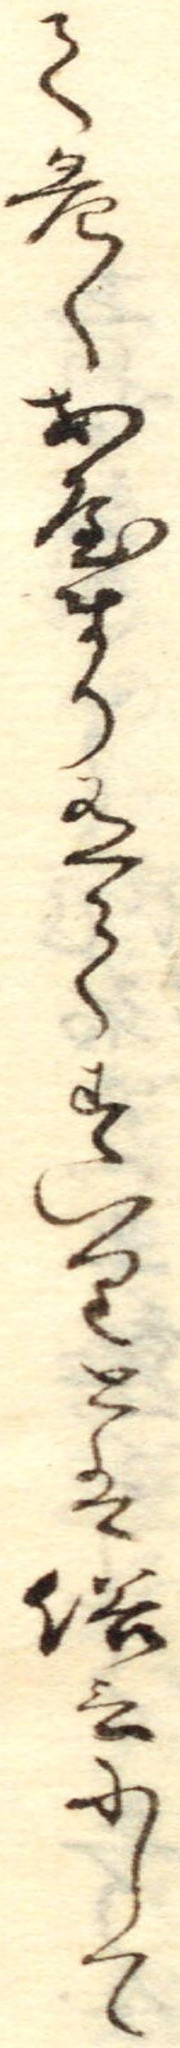て危くあやまり有てすいりとは俗言にして
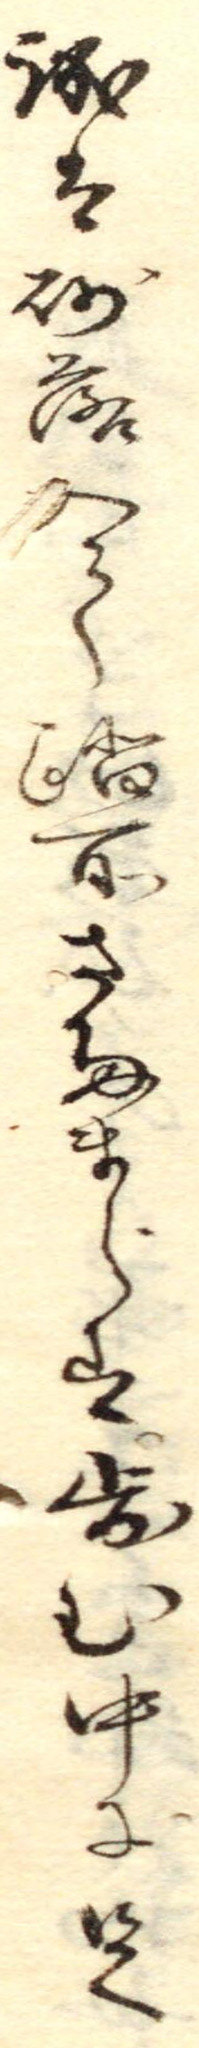誠は砂落入て踏所さたまらす歩む中に足
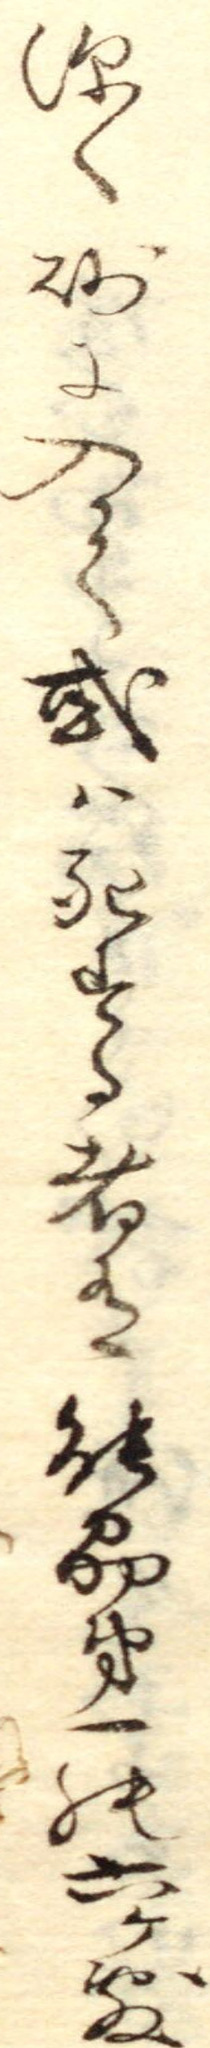深く砂に入て或は死する者有能州第一の六ヶ敷
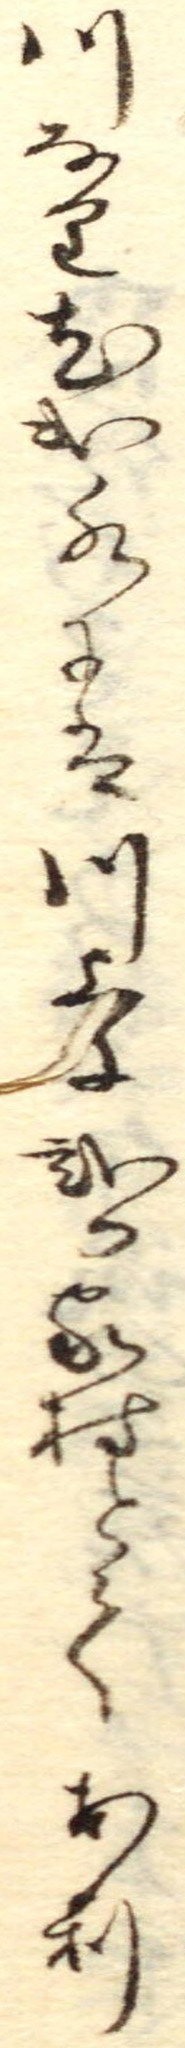川なり尤出水には川上に弐つ家村とてあり
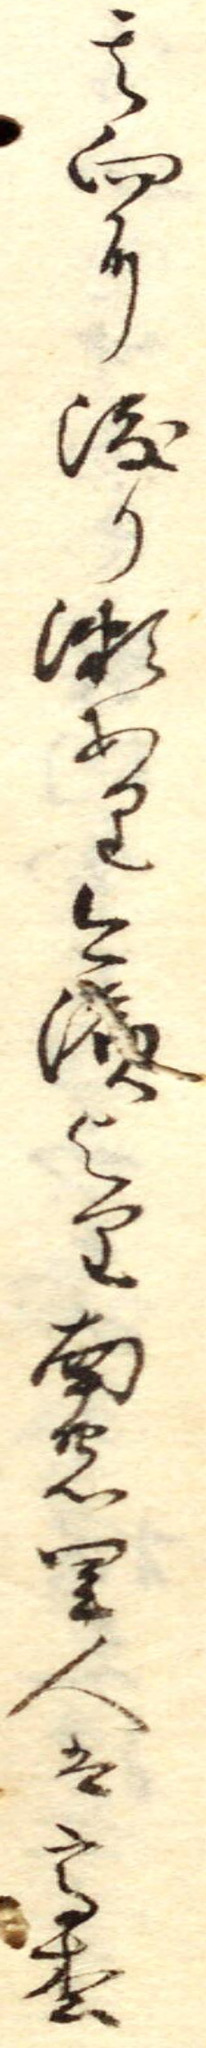其向に渡り瀬あり今濱より南の里人は高枩
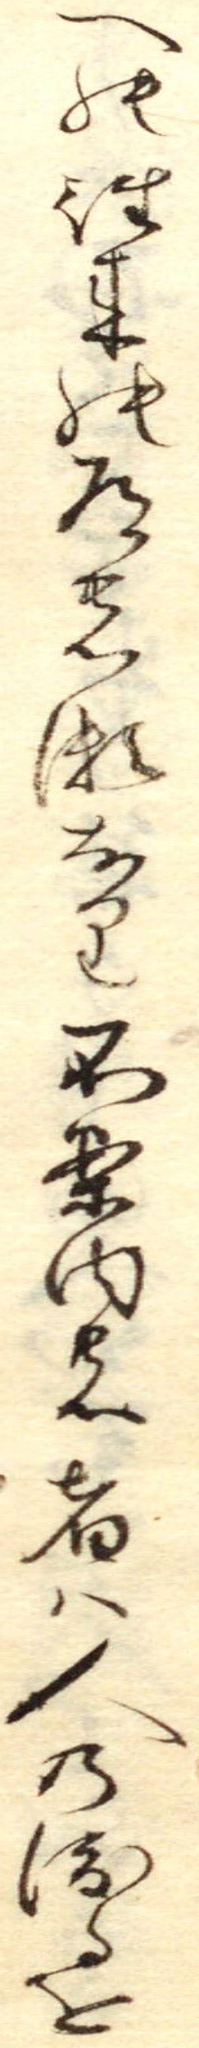への往来の道の瀬なり不案内の者は人の渡るを
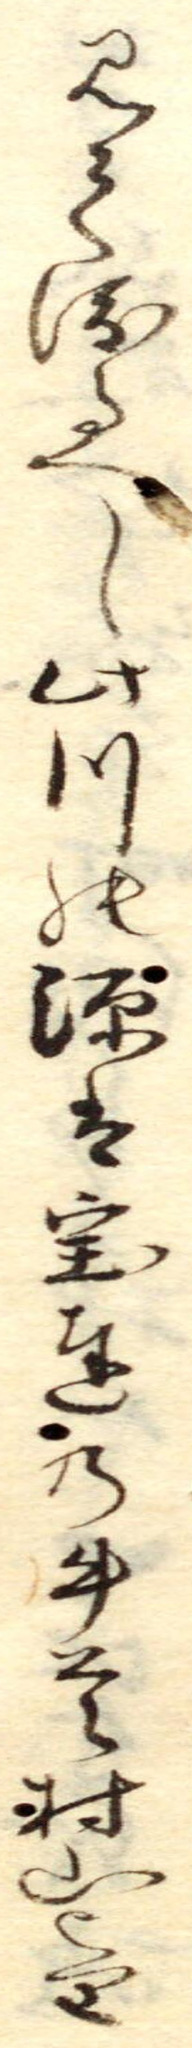見て渡るへし此川の源は宝達の牛首村山より
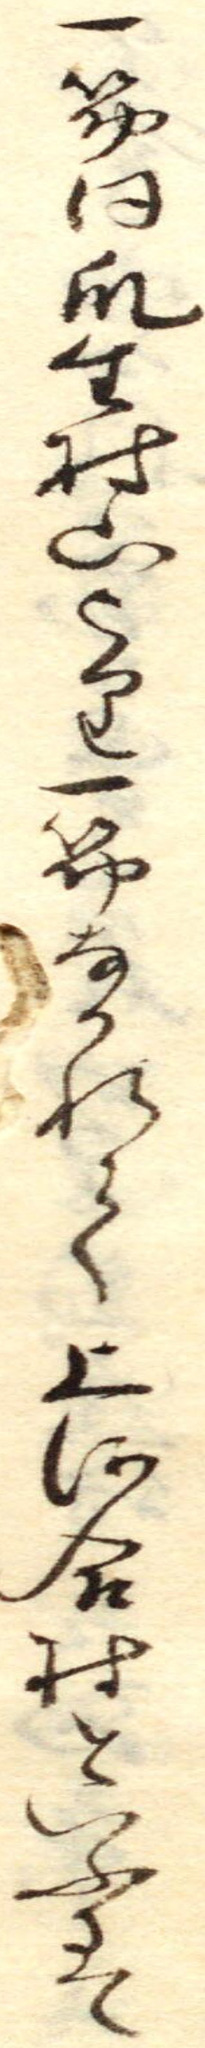一筋同瓜生村山より一筋なかれて上河合村といふにて
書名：能登名跡誌
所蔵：Ishikawa Prefectural Library
